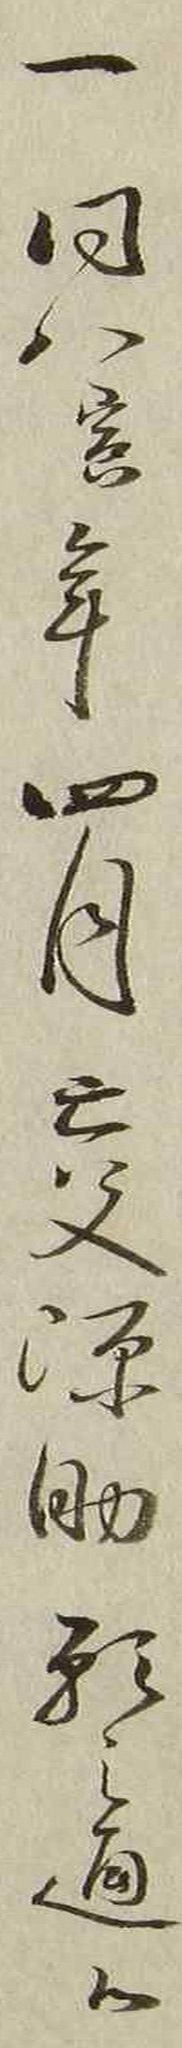一同八寅年四月亡父源助願之通御
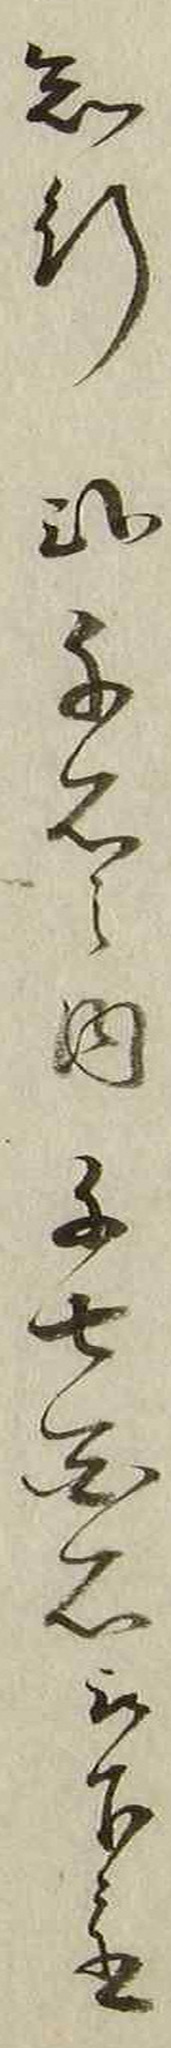知行弐千石之内千七百石被下置
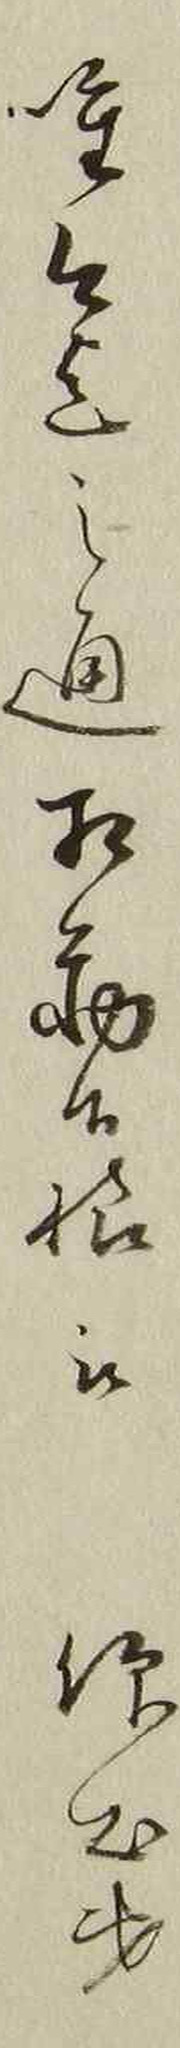唯今迄之通相勤候様被仰出弟
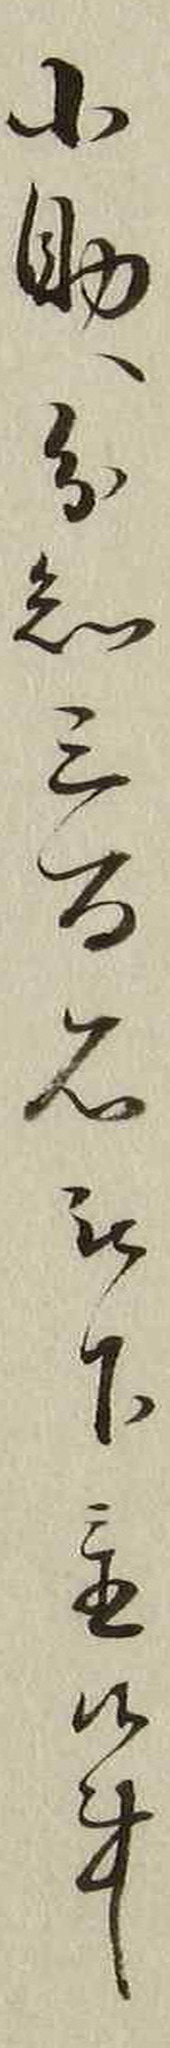小助へ分知三百石被下置候事
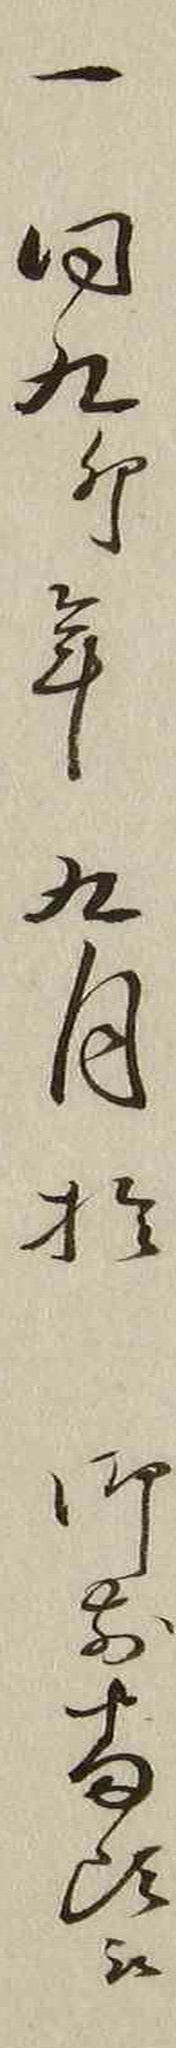一同九卯年九月於御前番頭被
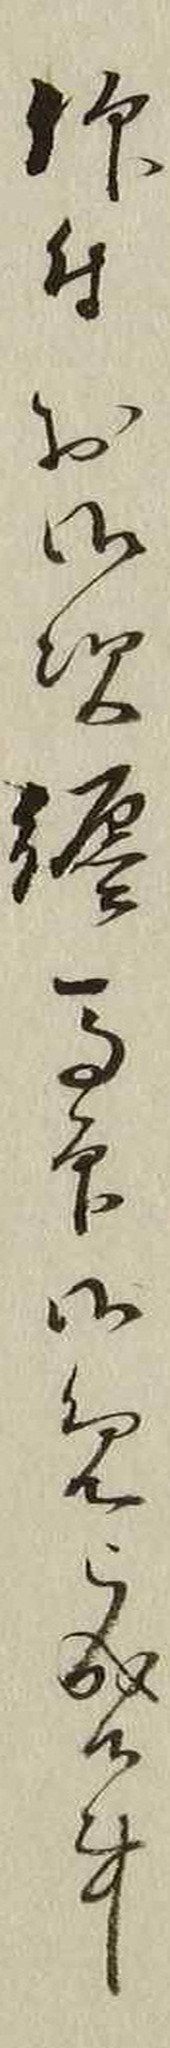仰付於御次纏馬印御免被成候事
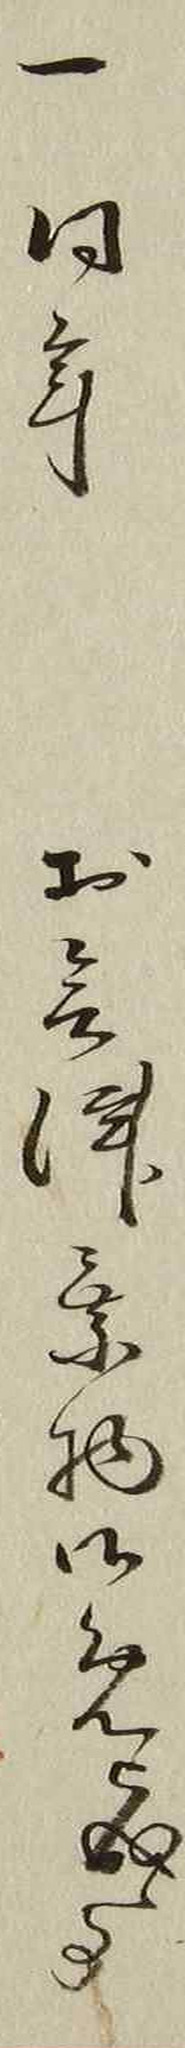一同年於会津乗物御免被成候事
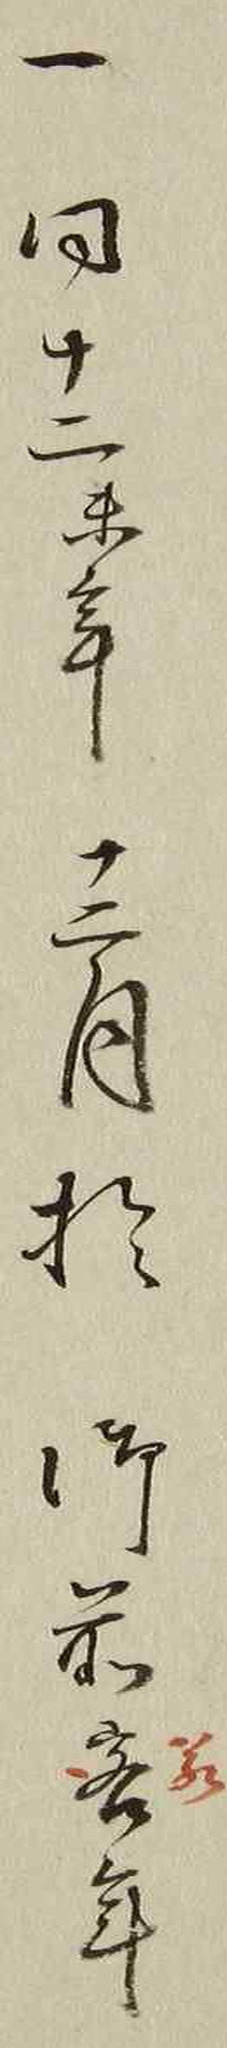一同十二未年十二月於御前若年
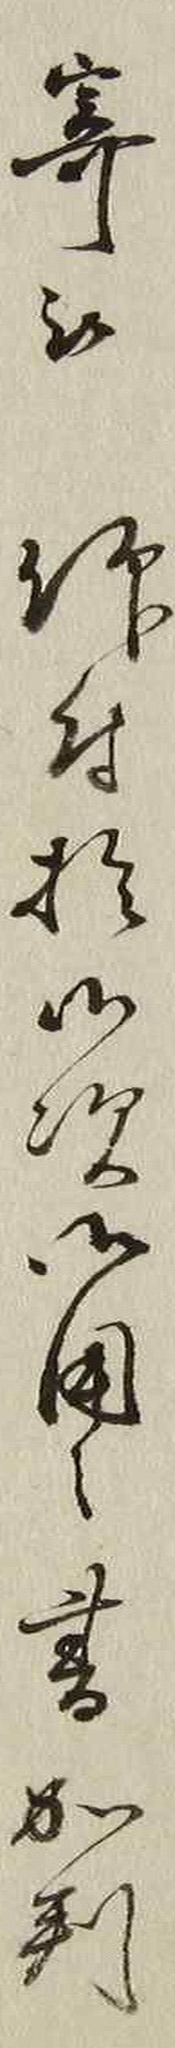寄被仰付於御次御用之書加判
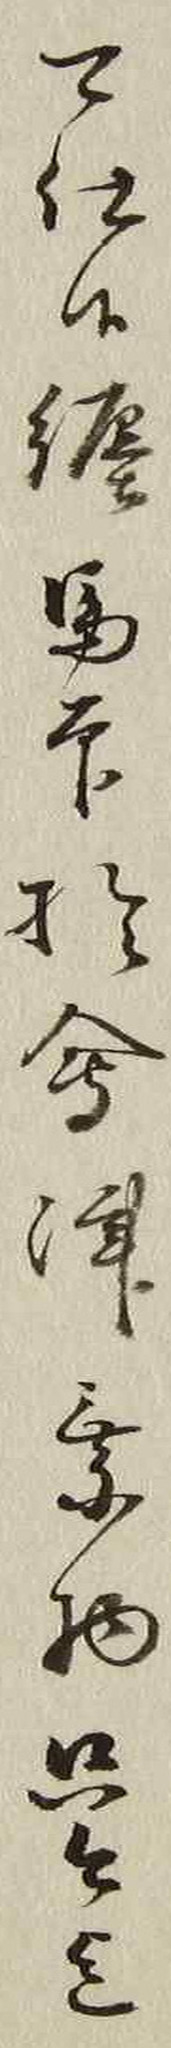可仕候纏馬印於会津乗物只今迄
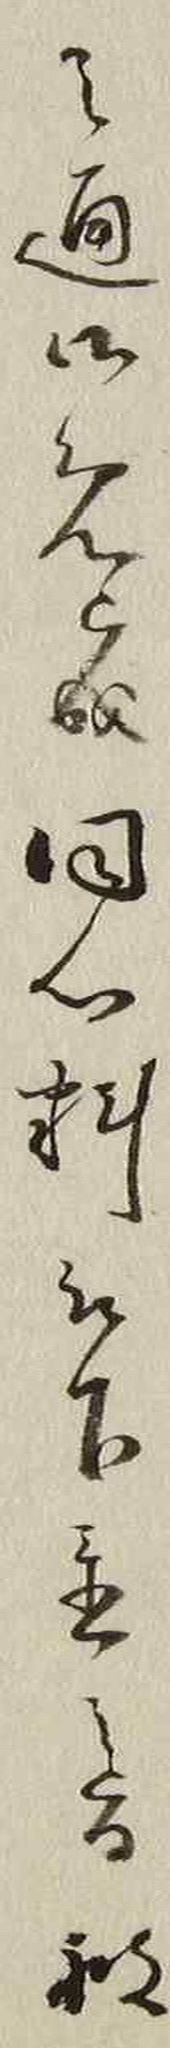之通御免被成同心料被下置之旨被
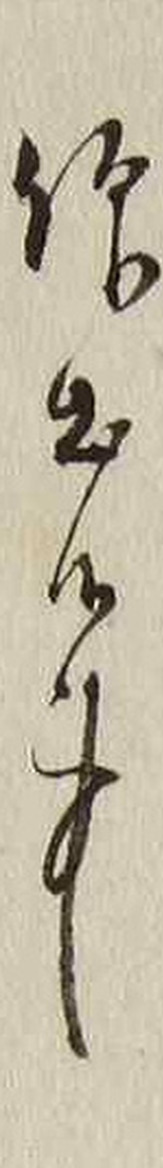仰出候事
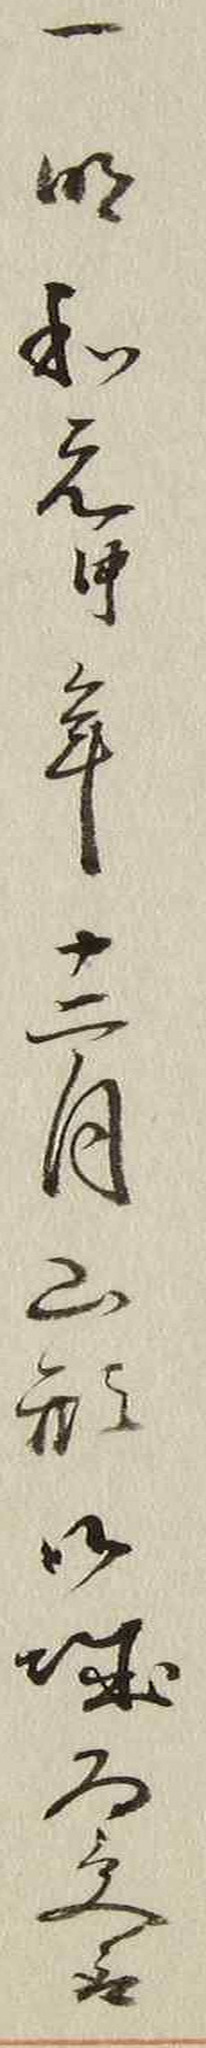一明和元申年十二月山形御城為受取
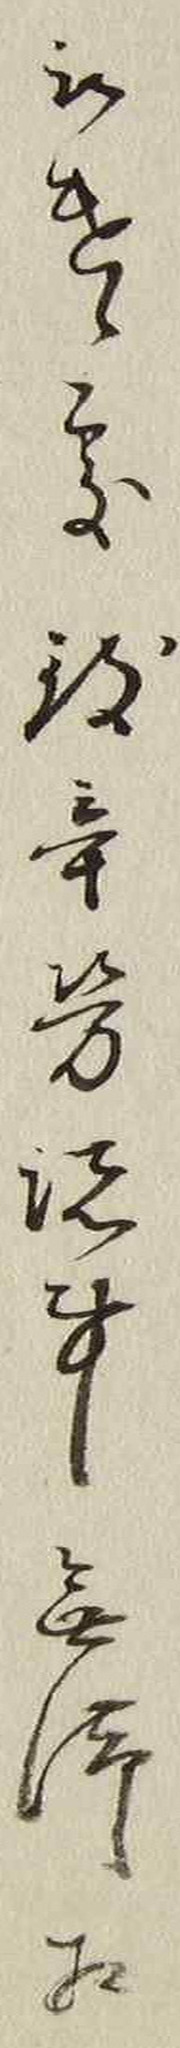被遣候所致辛労諸事無滞相
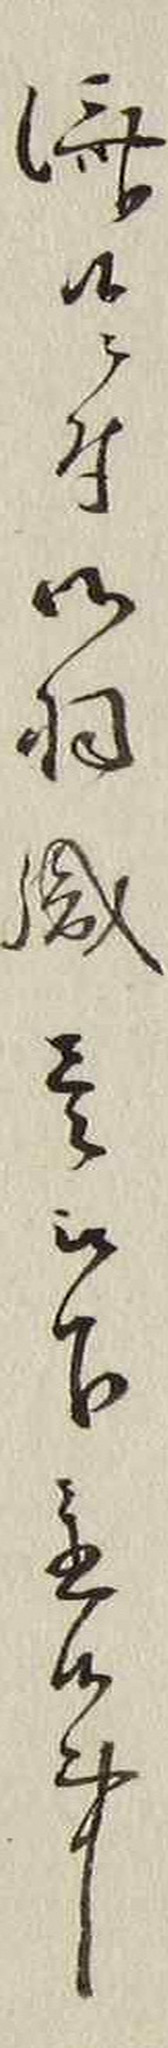済候に付御羽織壱被下置候事
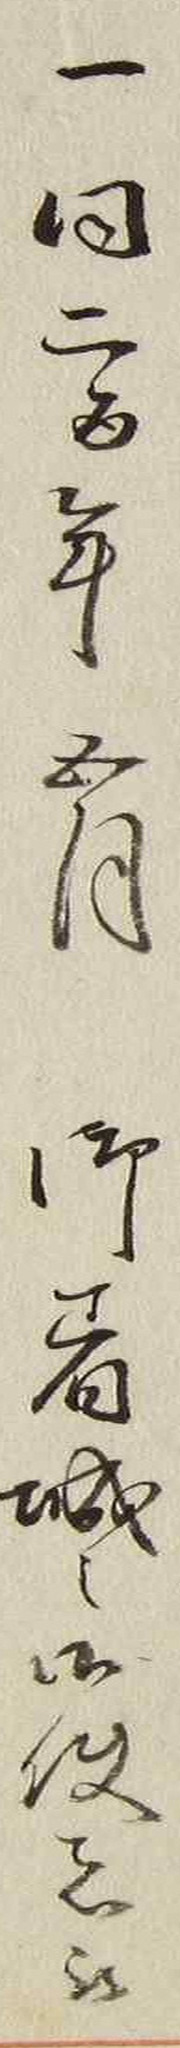一同二酉年五月御着城之御使者被
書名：諸士系譜　巻之159　な之部1
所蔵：会津若松市立会津図書館
